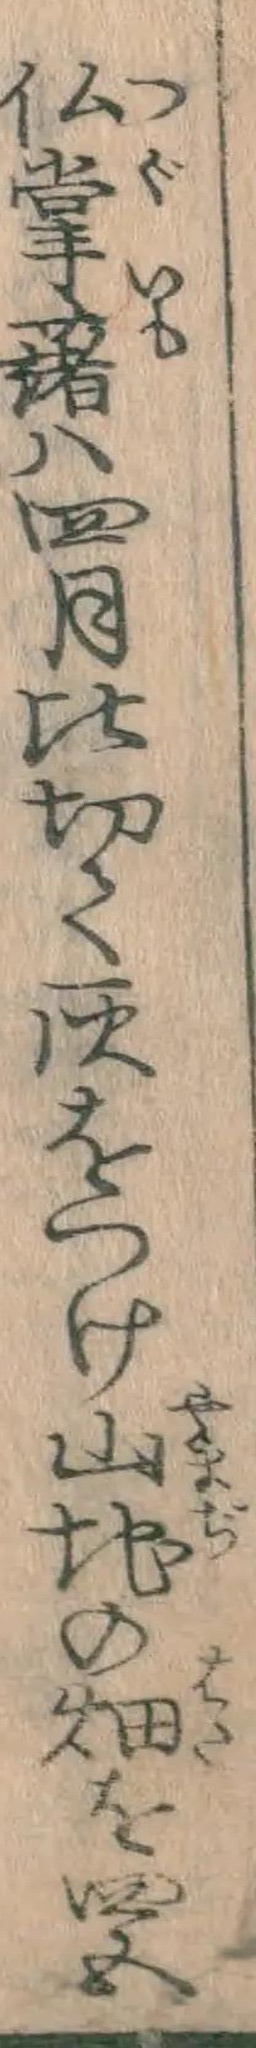仏掌藷は四月比切て灰をつけ山地の畑を四五
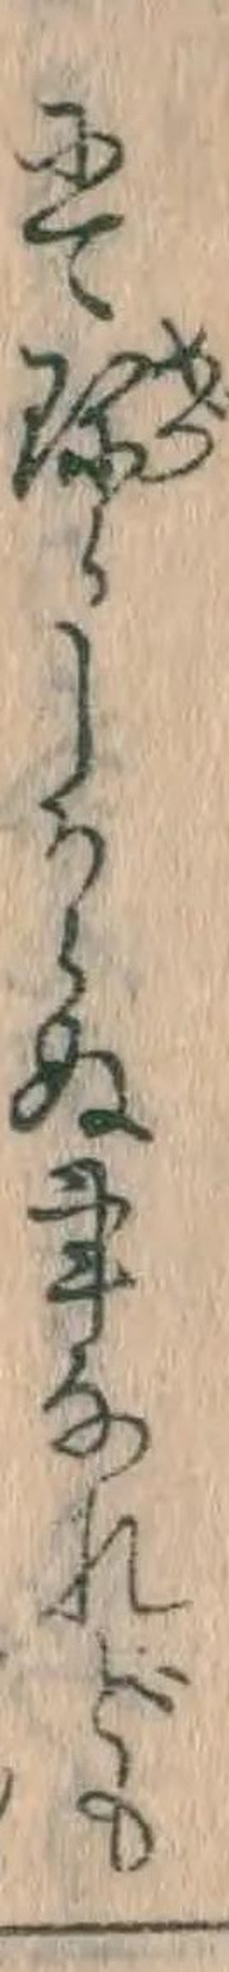にて珍らしからぬ事なれども
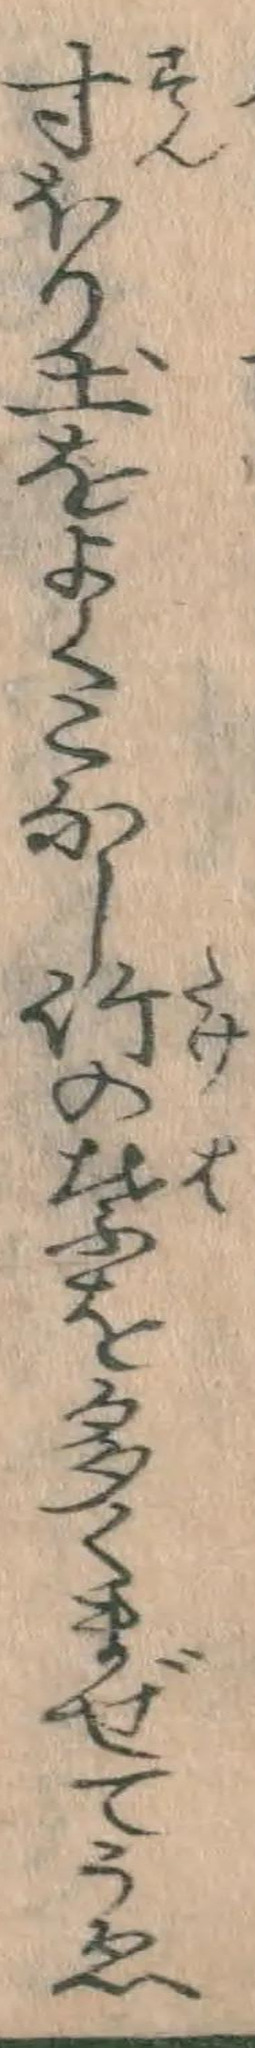寸ほり土をよくこなし竹の葉を多くまぜてうゑ
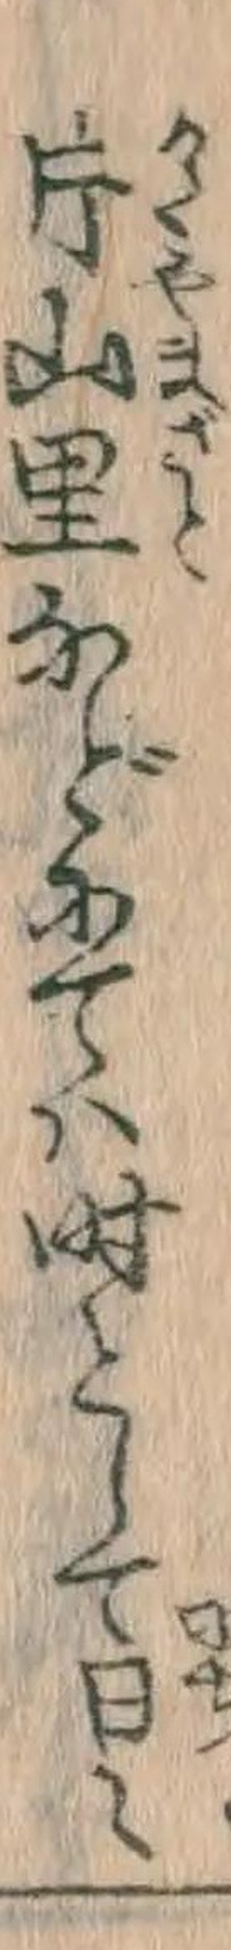片山里などにては時として日々
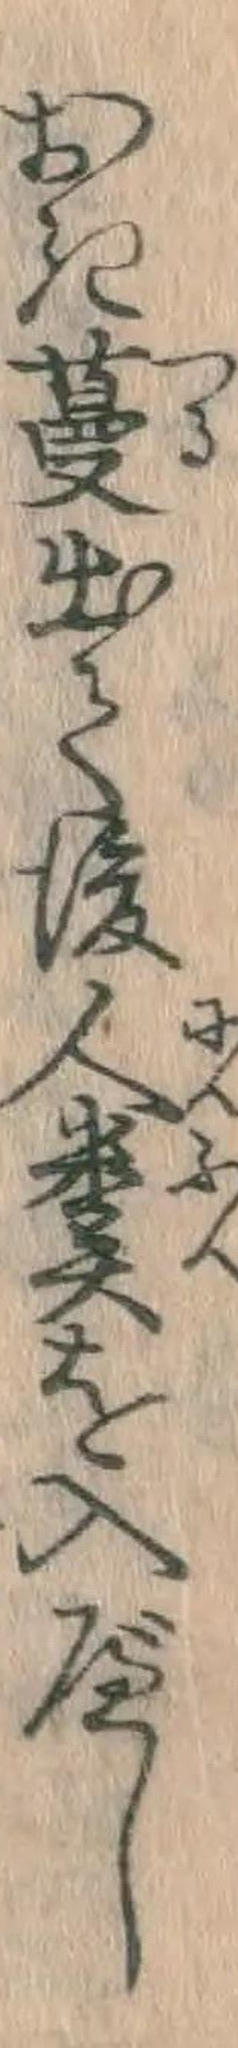おき蔓出て後人糞を入べし
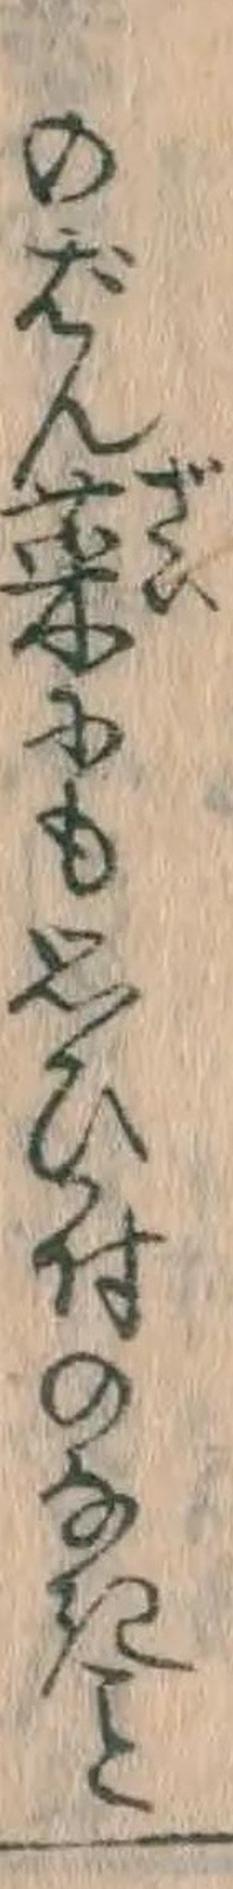のばん菜にも思ひ付のなきこと
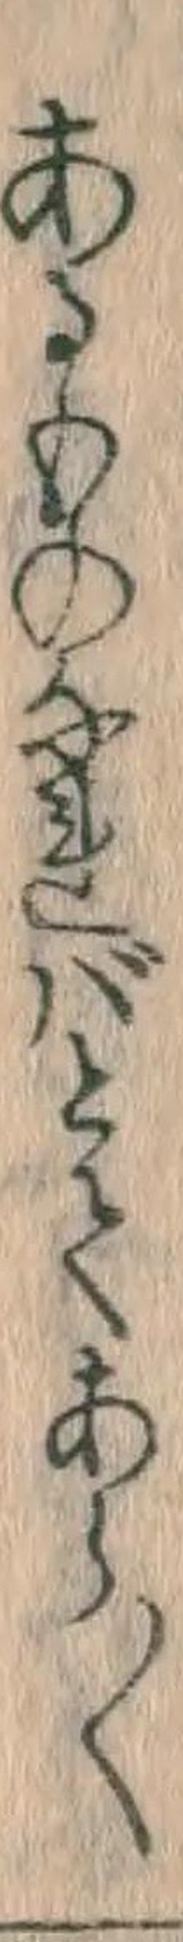あるものなればとてあら〳〵
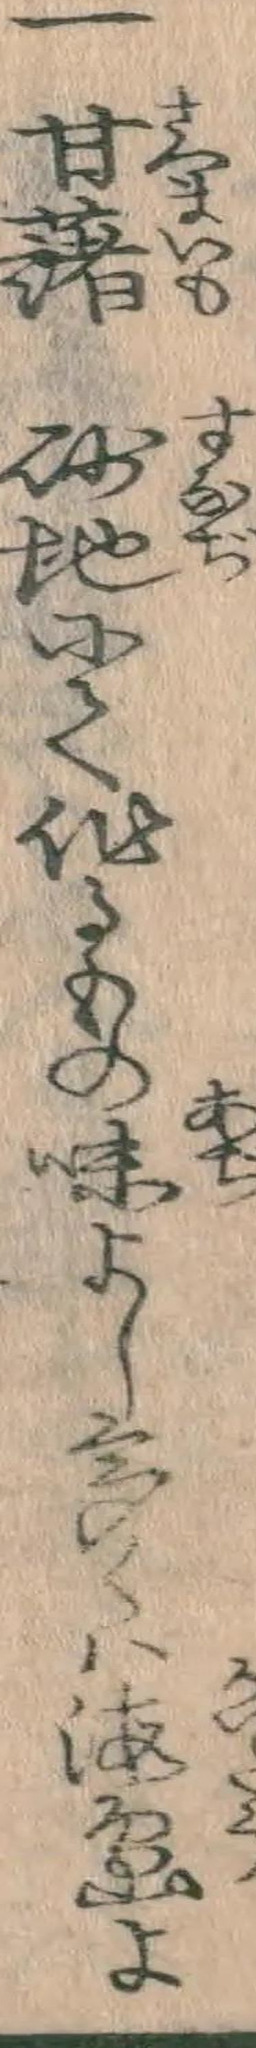一甘藷砂地にて作るもの味よし多くは海島よ
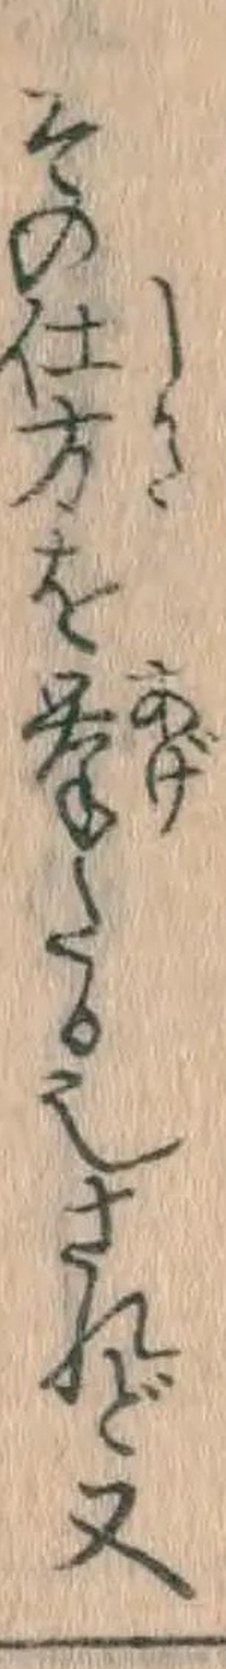その仕方を挙たる也されど又
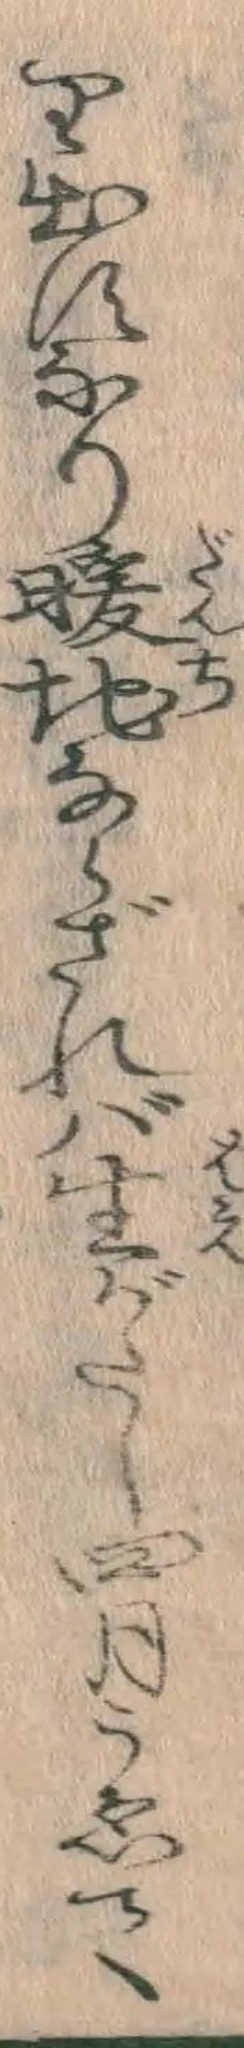り出すなり暖地ならざれば生がたし四月うゑて
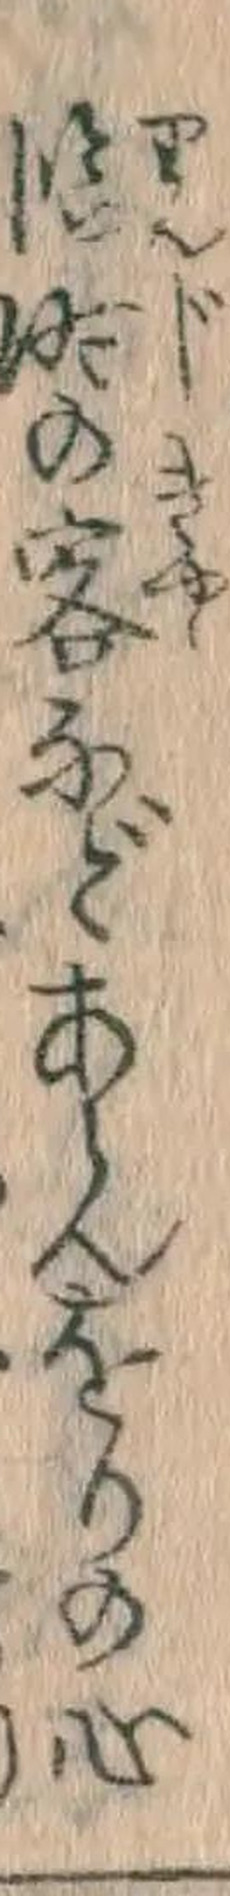臨時の客などあらんをりの心
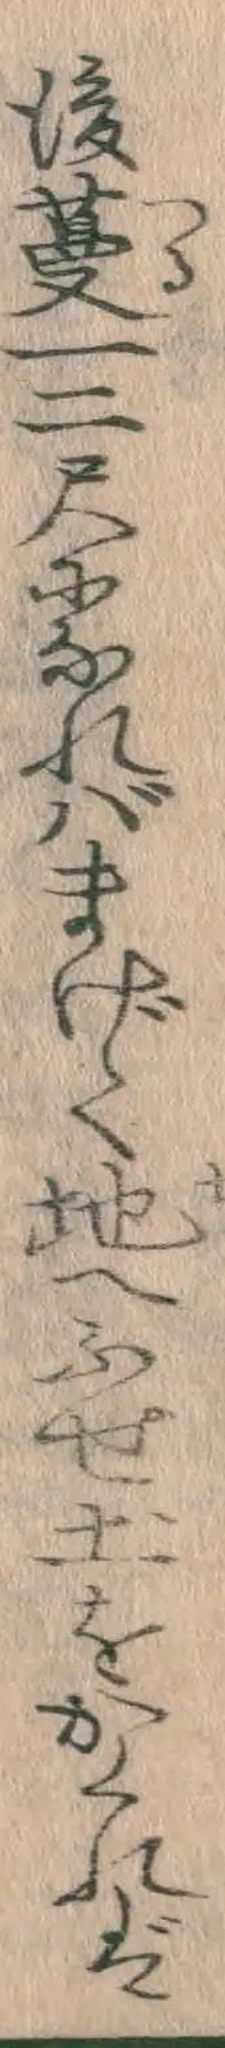後蔓一二尺になればまげて地へふせ土をかくれば
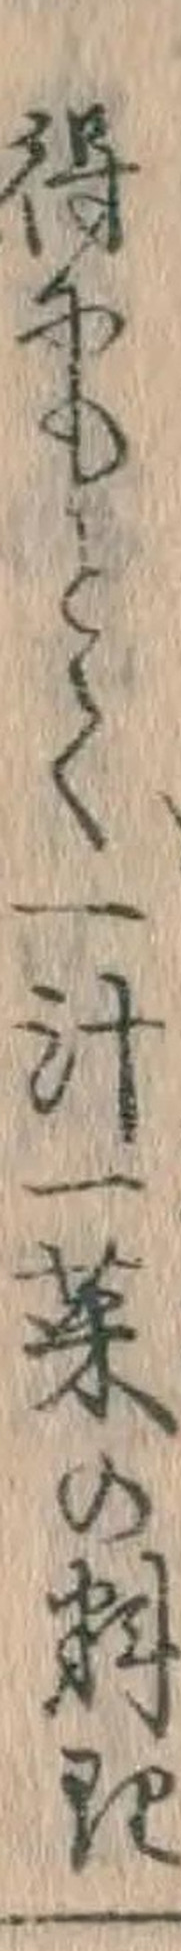得にもとて一汁一菜の料理
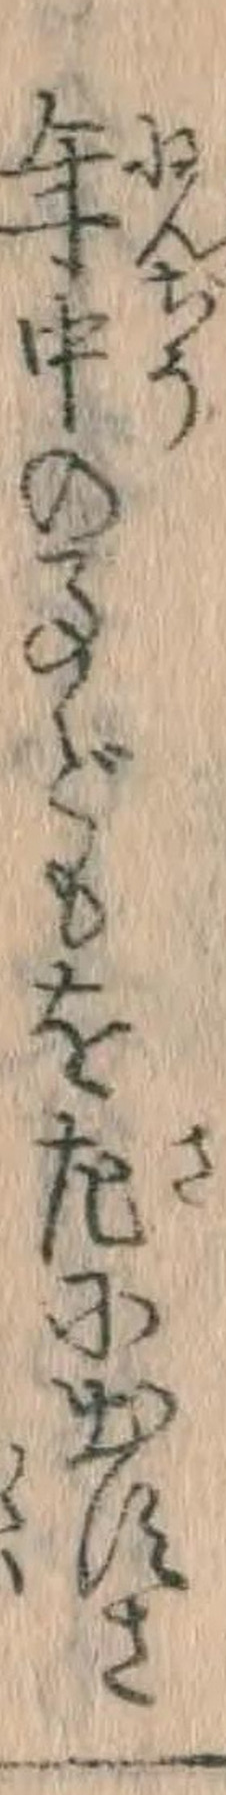年中の事どもを左に出すさ
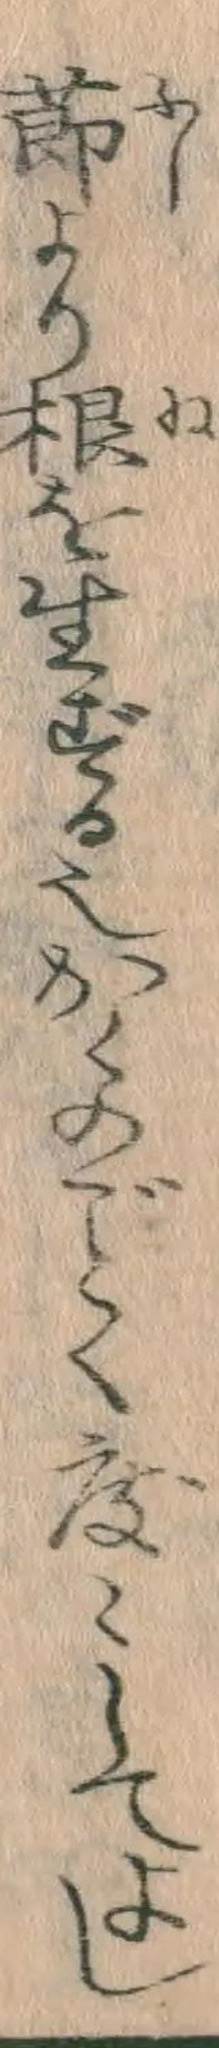節より根を生ずる也かくのごとく度々してよし
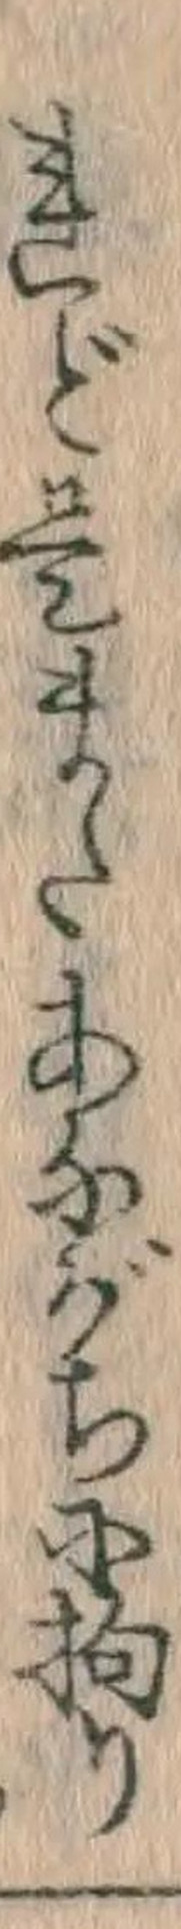れど是またあながちに拘り
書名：広益秘事大全 3巻. [5]
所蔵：国立国会図書館 National Diet Library, JAPAN
